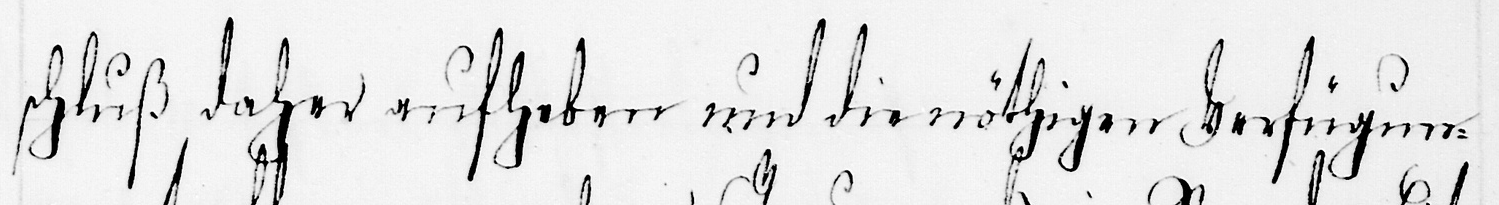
schluß daher aufheben und die nöthigen Verfügun¬
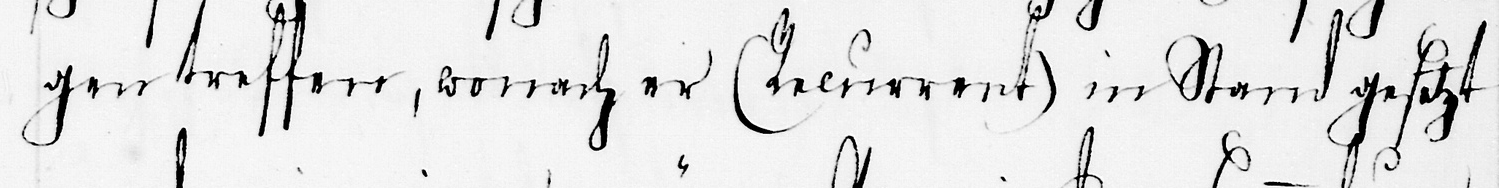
gen treffen, wonach er (Recurrent) in Stand gesetzt
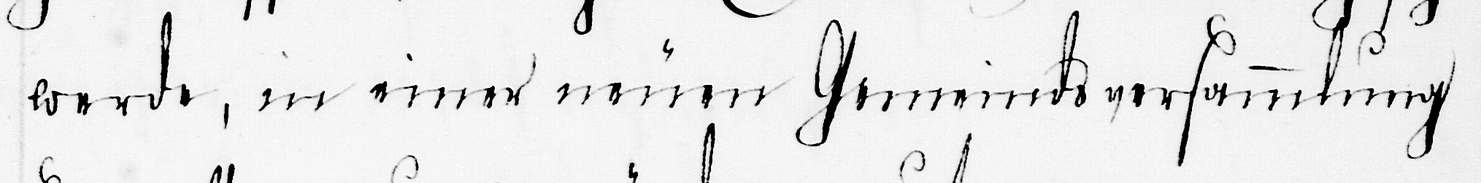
werde, in einer neuen Gemeindsversammlung
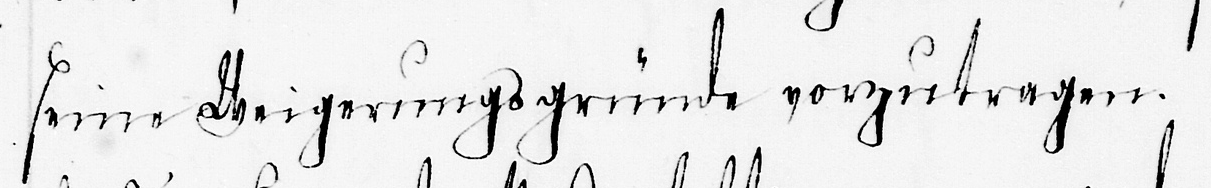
seine Weigerungsgründe vorzutragen.
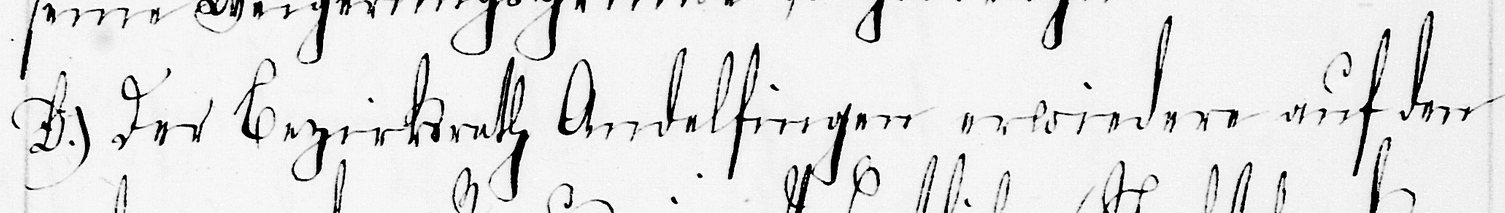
D.) Der Bezirksrath Andelfingen erwiedere auf den
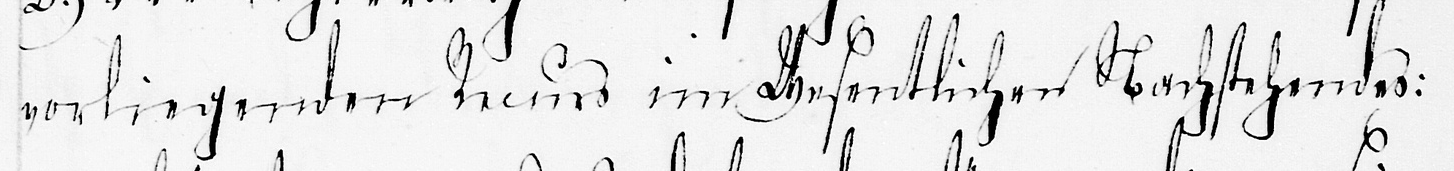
vorliegenden Recurs im Wesentlichen Nachstehendes:
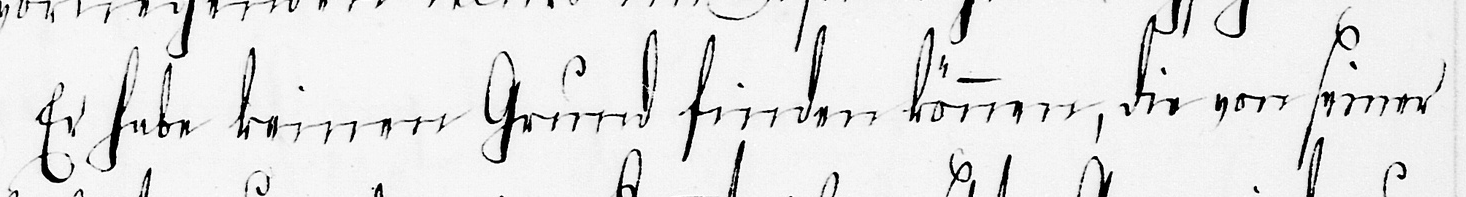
Er habe keinen Grund finden können, die von seiner
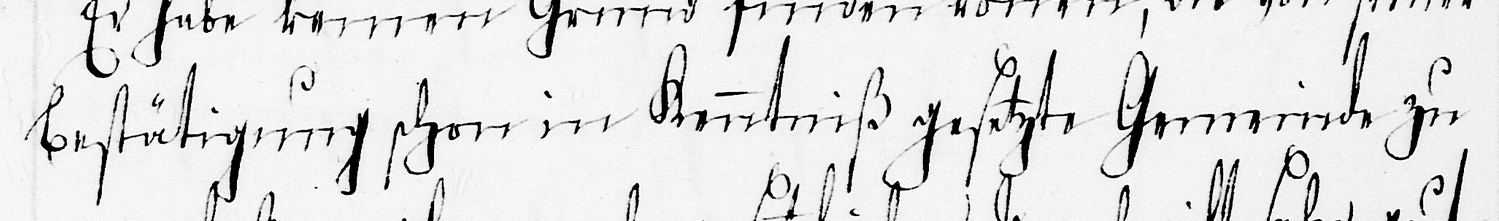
Bestätigung schon in Kenntniß gesetzte Gemeinde zu
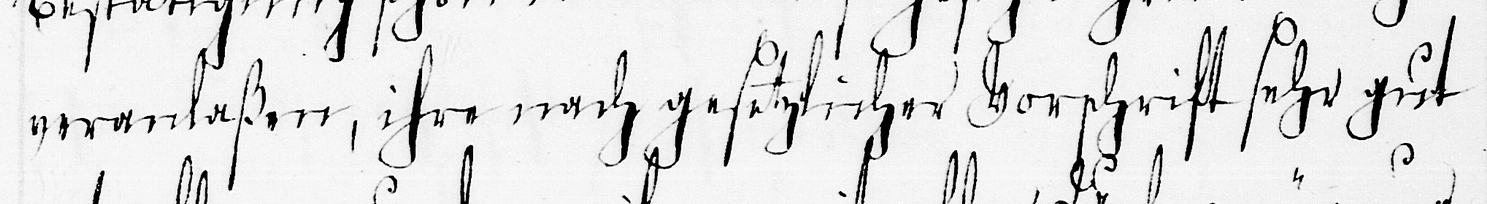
veranlaßen, ihre nach gesetzlicher Vorschrift sehr gut
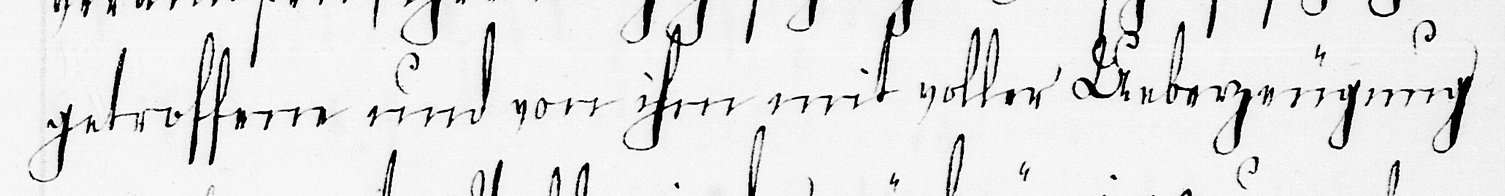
getroffen und von ihm mit voller Ueberzeugung
